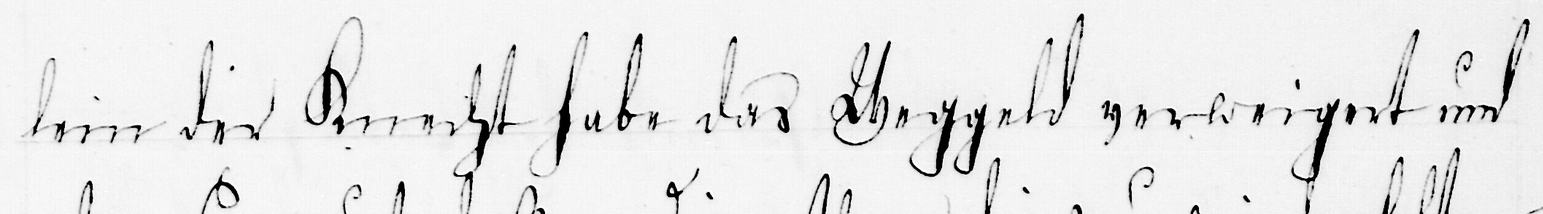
lein der Knecht habe das Weggeld verweigert und
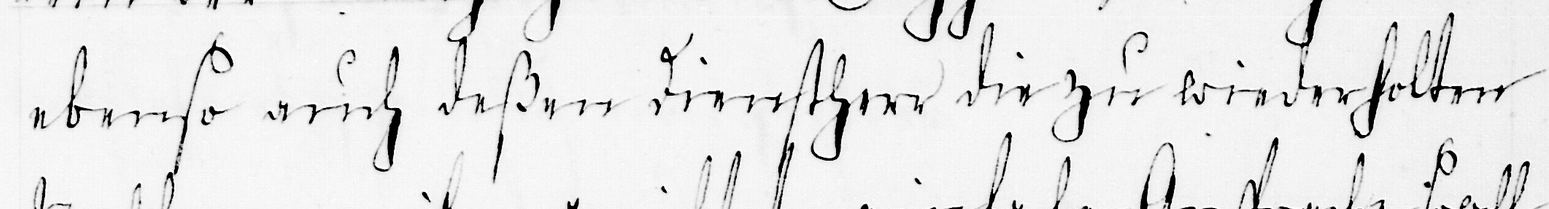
ebenso auch deßen Dienstherr die zu wiederholten
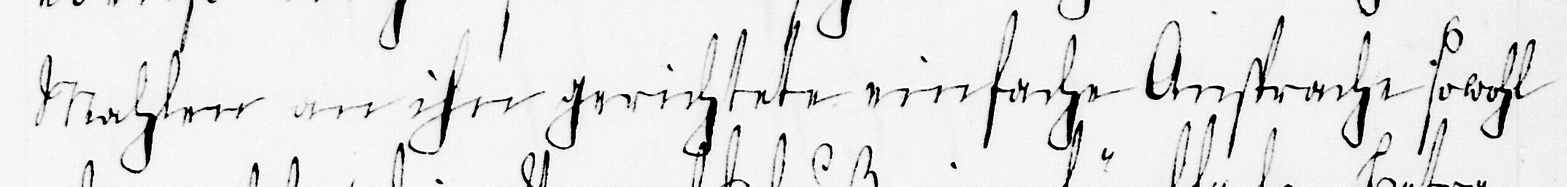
Mahlen an ihn gerichtete einfache Ansprache sowohl
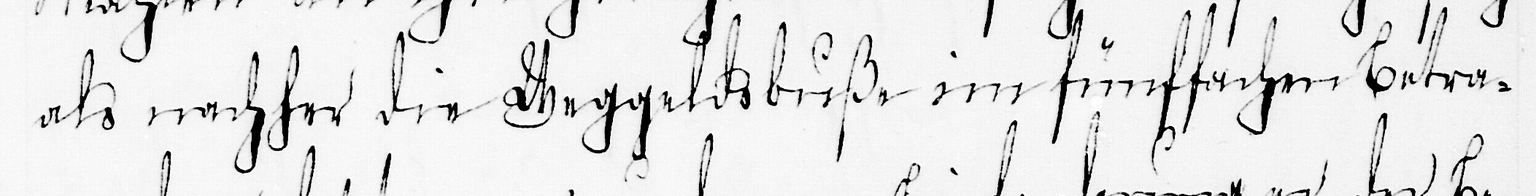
als nachher die Weggeldsbuße im fünffachen Betra¬
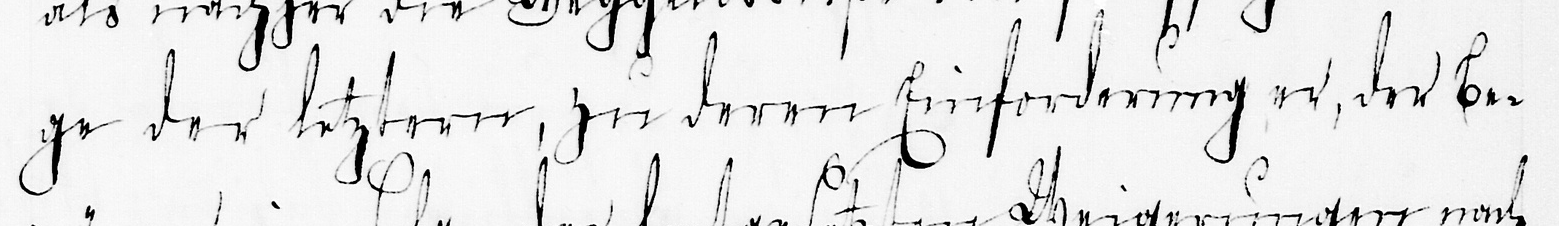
ge der letztern, zu deren Einforderung er, der Be¬
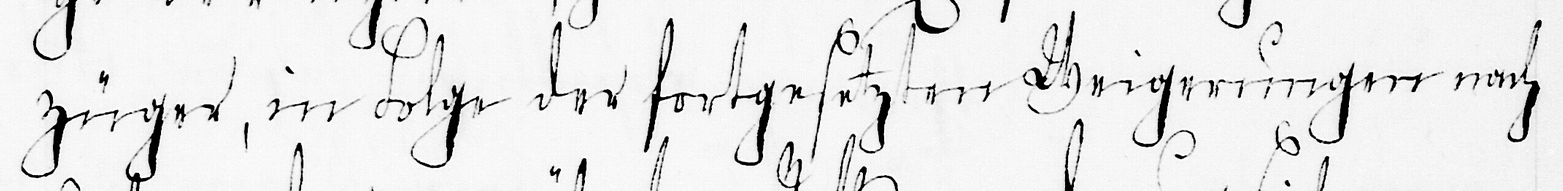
züger, in Folge der fortgesetzten Weigerungen nach
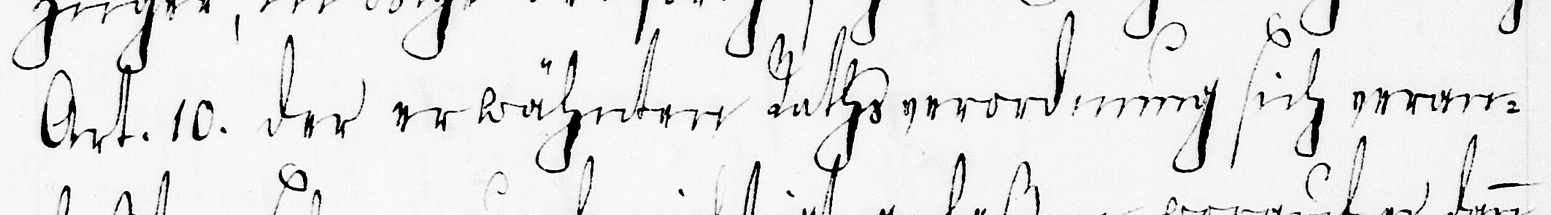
Art. 10. der erwähnten Rathsverordnung sich veran¬
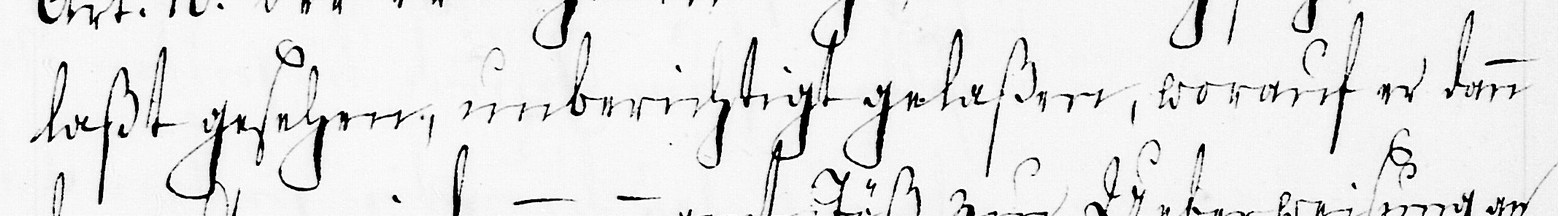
laßt gesehen, unberichtigt gelaßen, worauf er dann
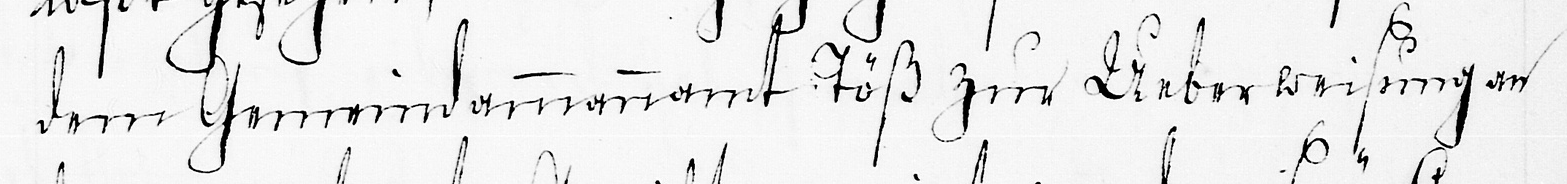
dem Gemeindammannamt Töß zur Ueberweisung an
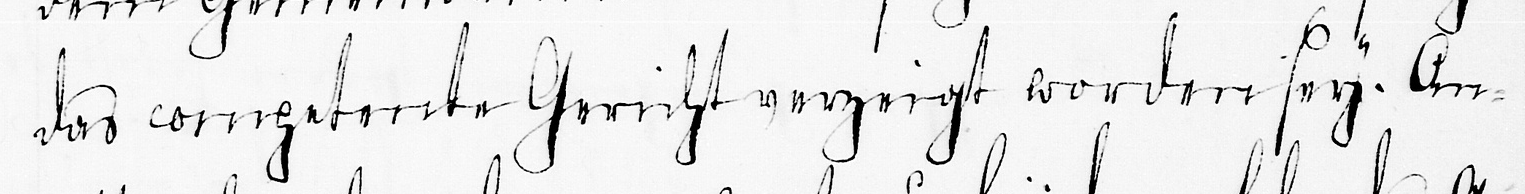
das competente Gericht verzeigt worden sey. Ans¬
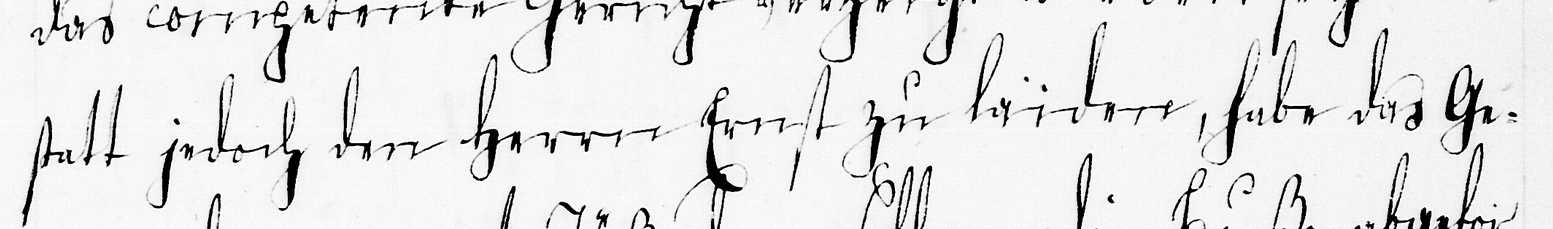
tatt jedoch den Herrn Ernst zu laiden, habe das Ge¬
